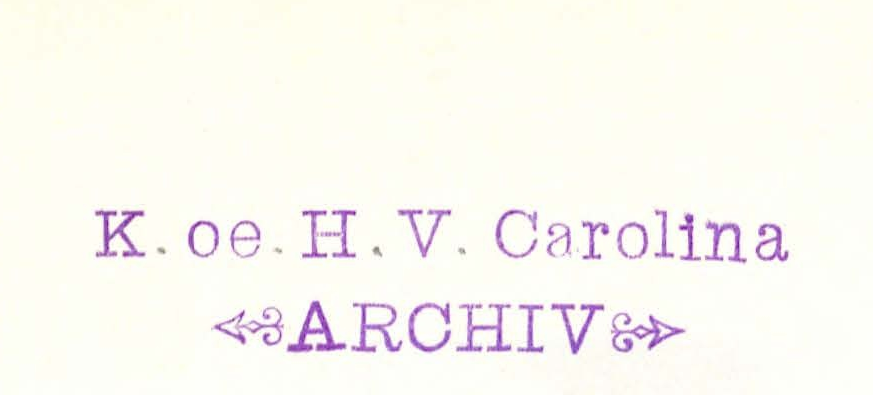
K. oe. H. V. Carolina
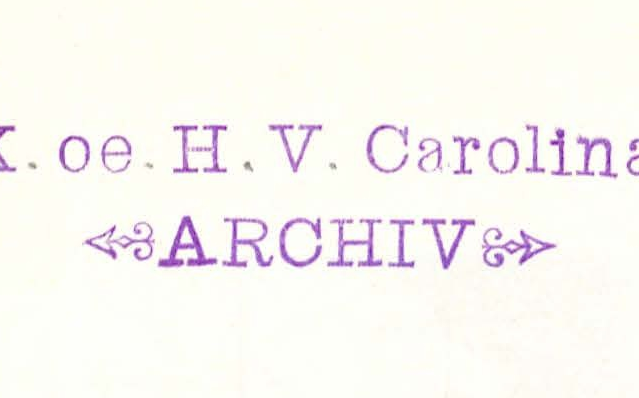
Archiv
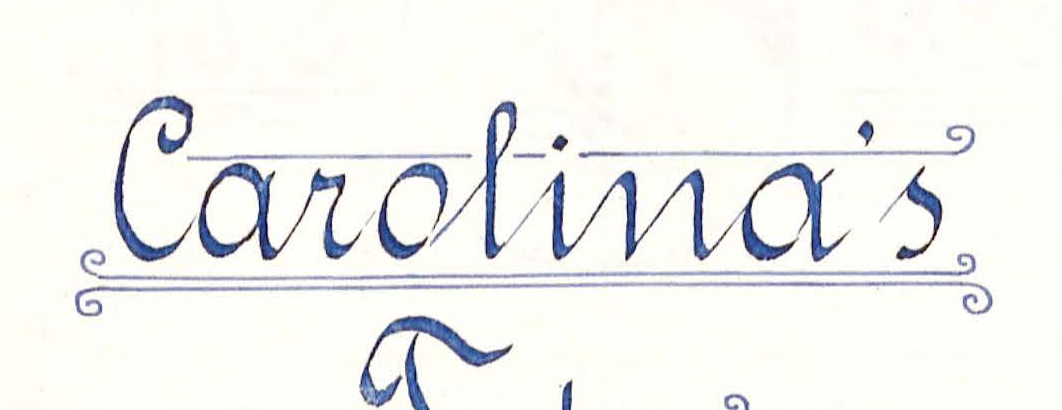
Carolina's
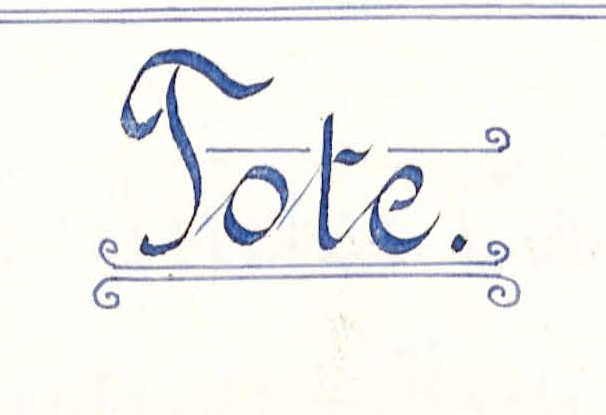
Tote.
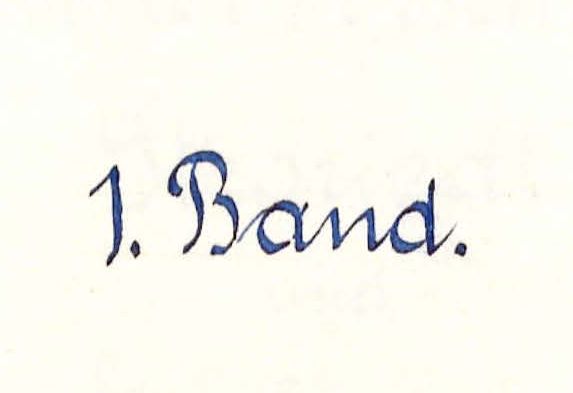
1. Band.
